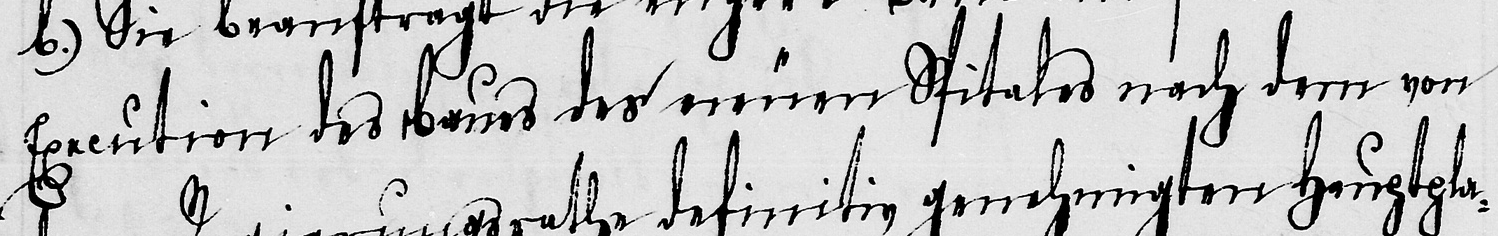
Execution des Baues des neuen Spitales nach dem von
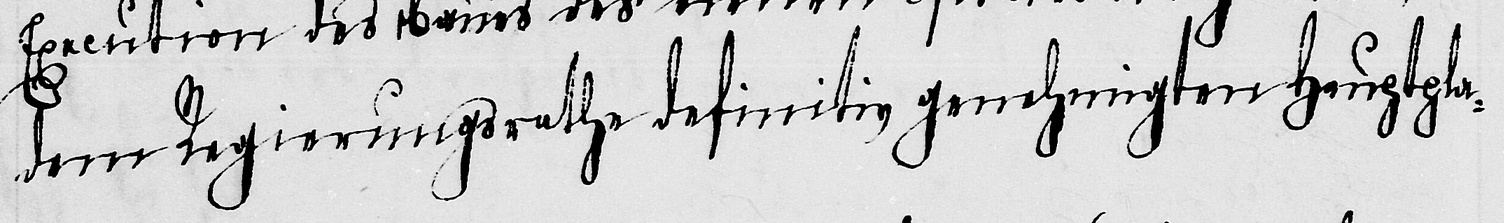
dem Regierungsrathe definitiv genehmigten Hauptpla¬
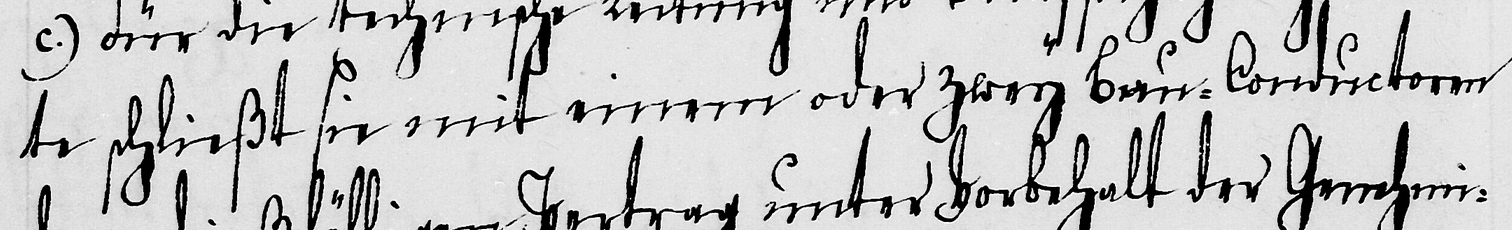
te schließt sie mit einem oder zwey Bau-Conductoren
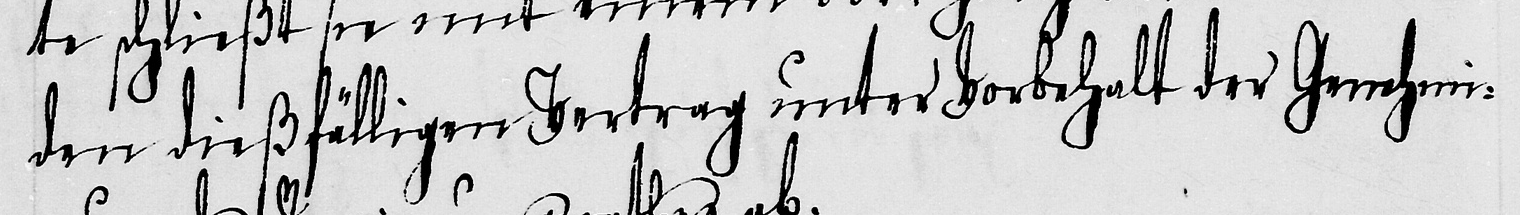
den dießfälligen Vertrag unter Vorbehalt der Genehmi¬
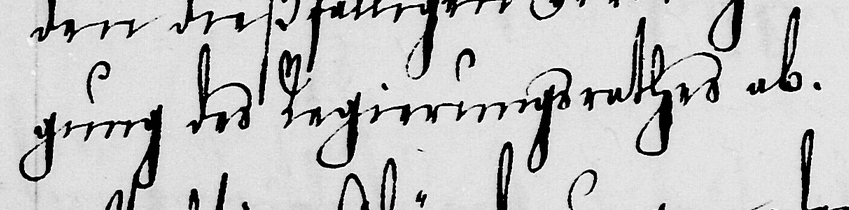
gung des Regierungsrathes ab.
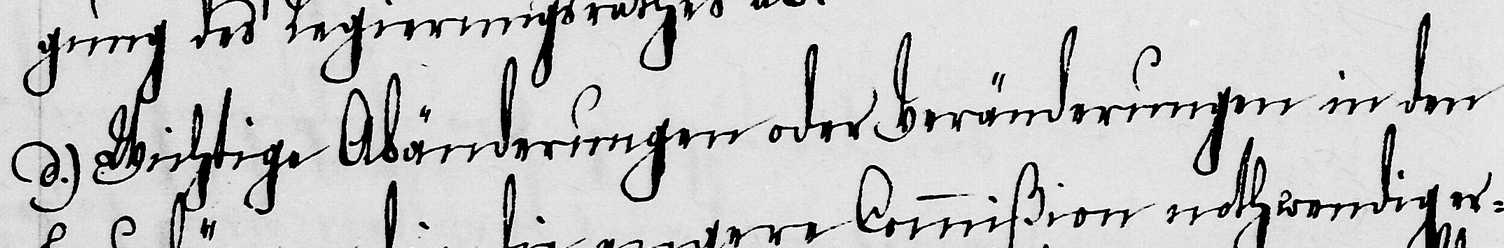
d.) Wichtige Abänderungen oder Veränderungen in den
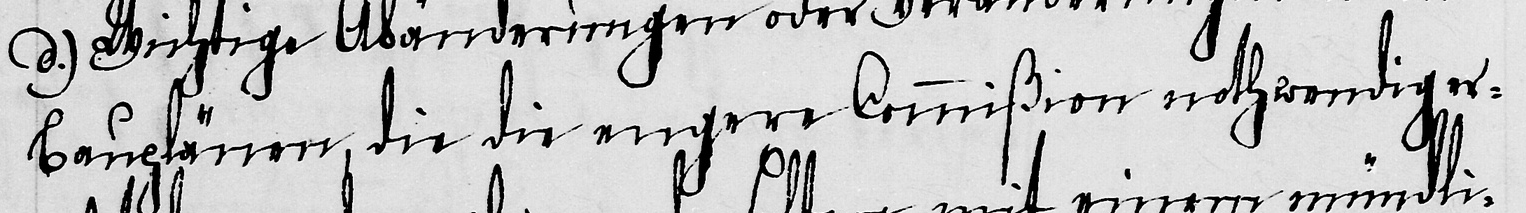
Bauplänen, die die engere Commißion nothwendig er¬
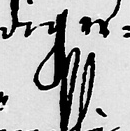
Se¬
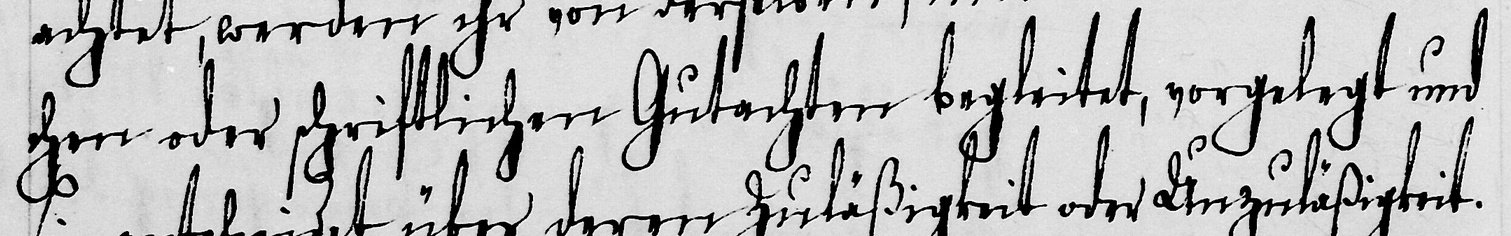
hen oder schriftlichen Gutachten begleitet, vorgelegt
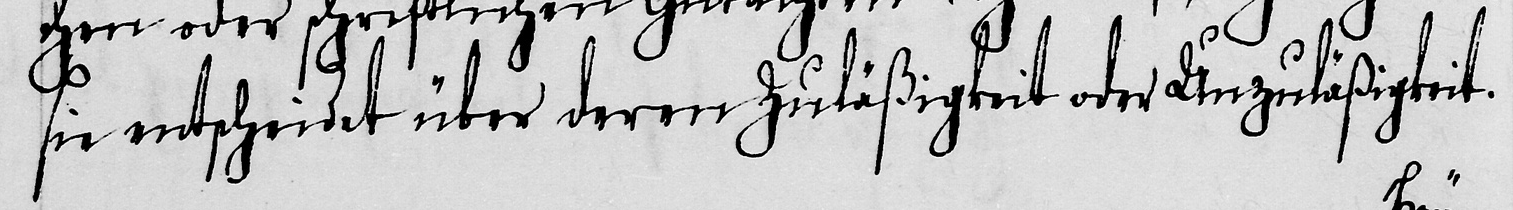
sie entscheidet über deren Zuläßigkeit oder Unzuläßigkeit.
